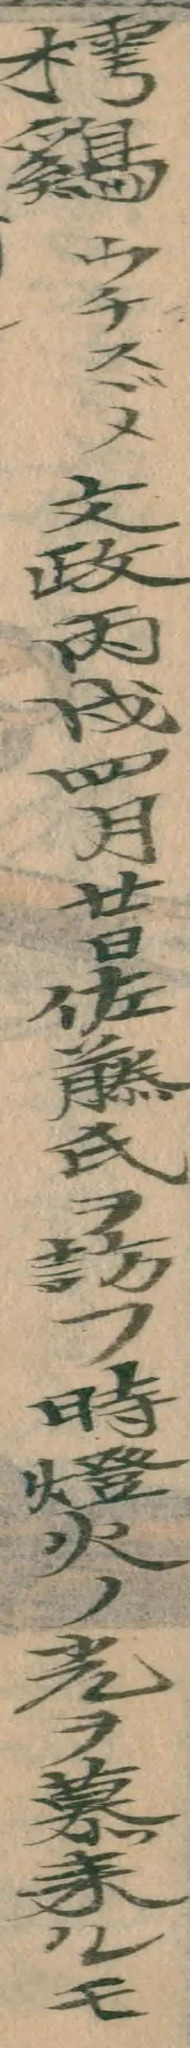樗鶏ウチスヾメ文政丙戌四月廿日佐藤氏ヲ訪フ時燈火ノ光ヲ慕来ルモ
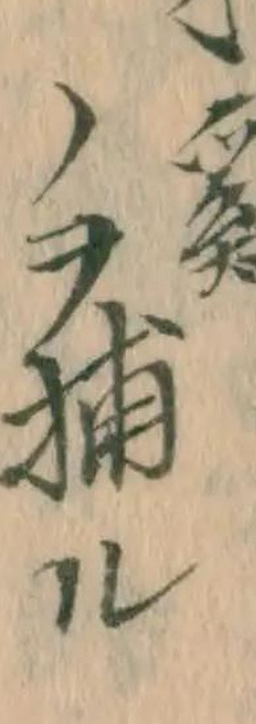ノヲ捕ル
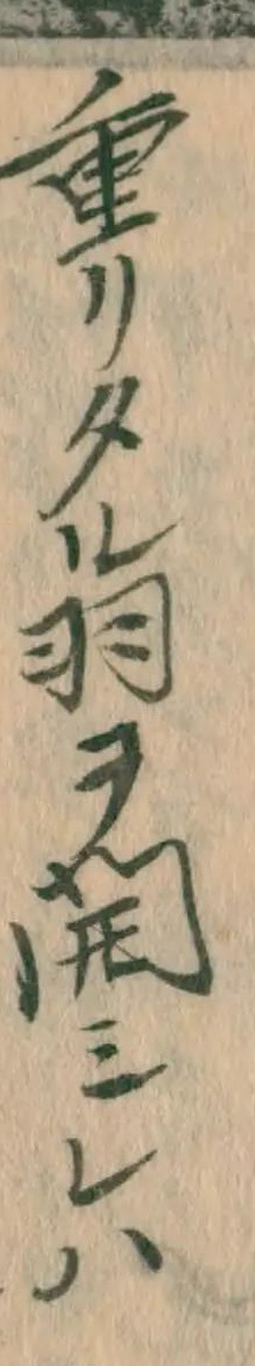重リタル羽ヲ開ミレハ
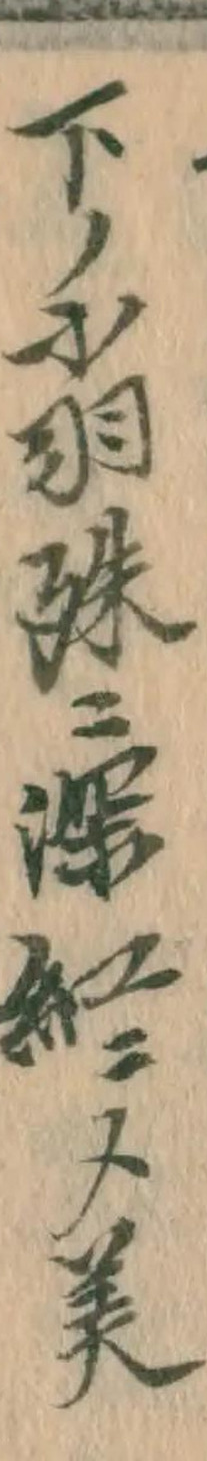下ノ小羽殊ニ深紅ニシテ美
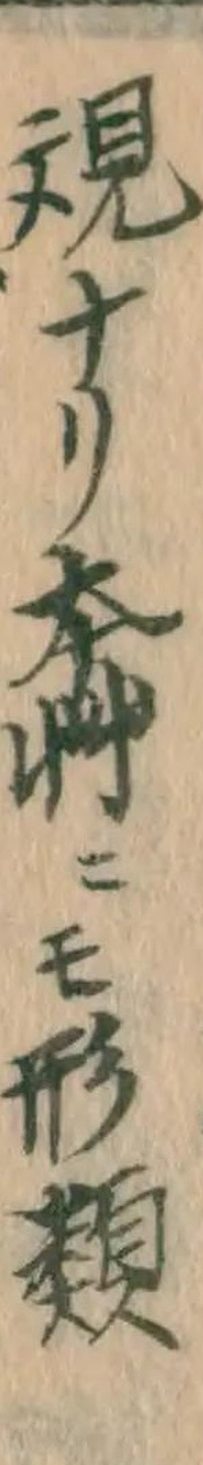覌ナリ本艸ニモ形類
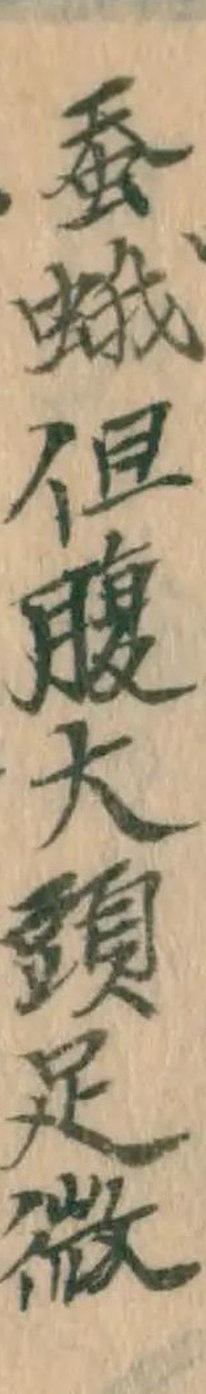蚕蛾但腹大頭足微
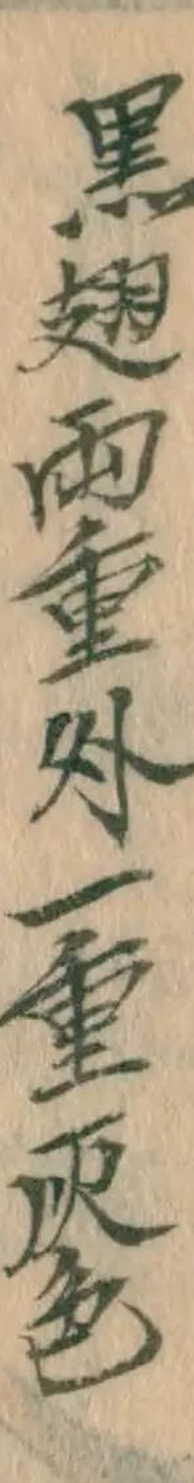黒翅両重外一重灰色
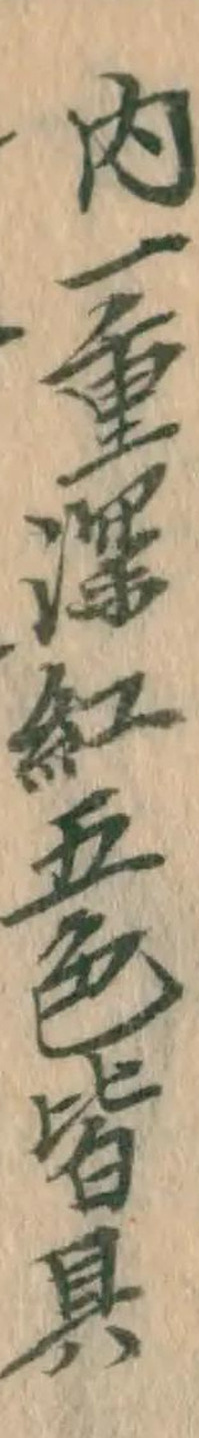内一重深紅五色皆具
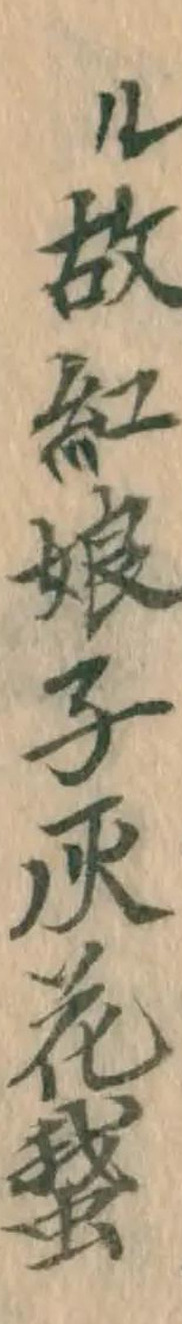ル故紅娘子灰花䖸
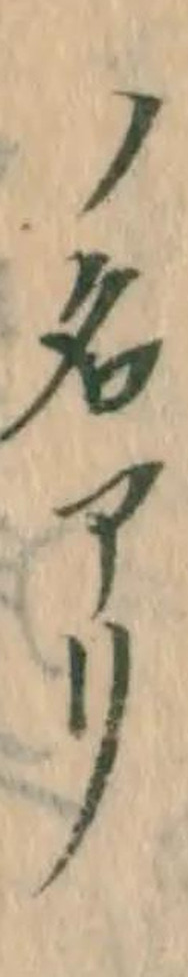ノ名アリ

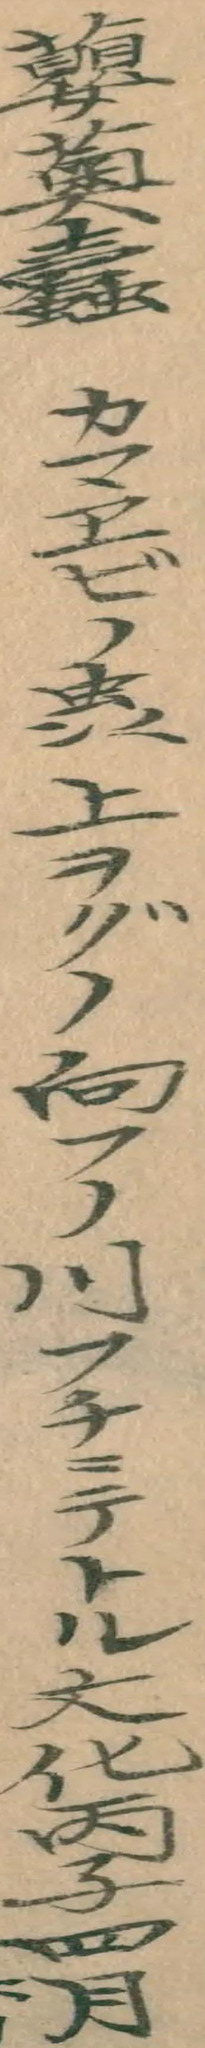蘡薁蠹カマヱビノ蟲上ヲグノ向フノ川フチニテトル文化丙子四月六日
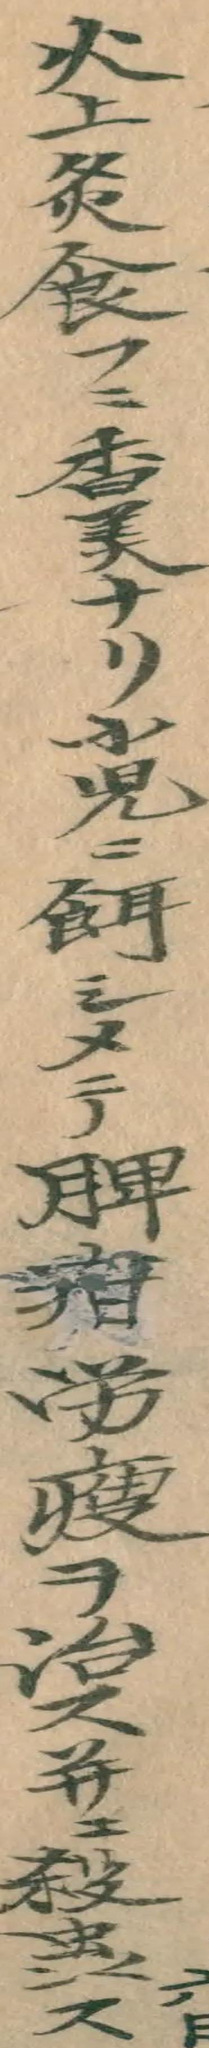火上炙食フニ香美ナリ小児ニ餌シメテ脾疳労瘦ヲ治ス幷ニ殺蟲ス
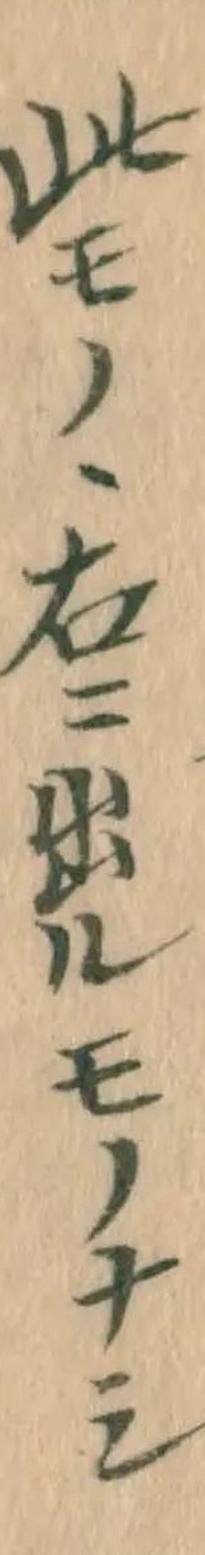此モノヽ右ニ出ルモノナシ
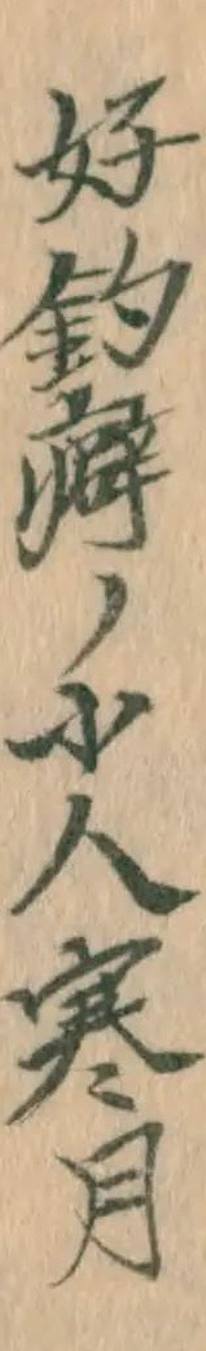好釣癖ノ小人寒月
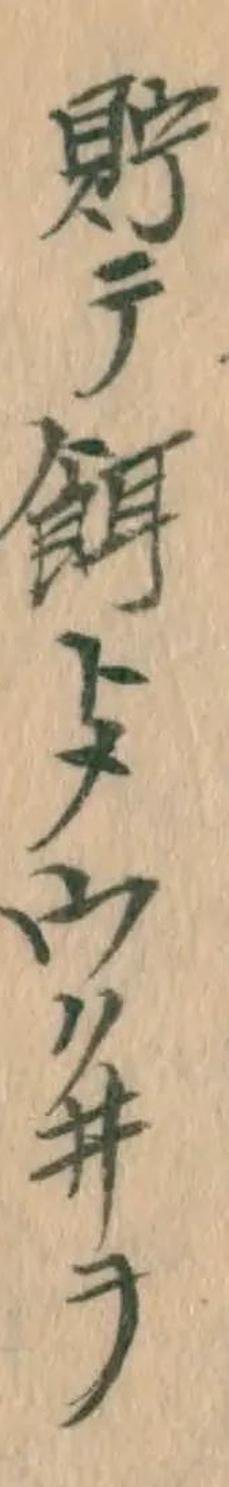貯テ餌トシテウクヰヲ
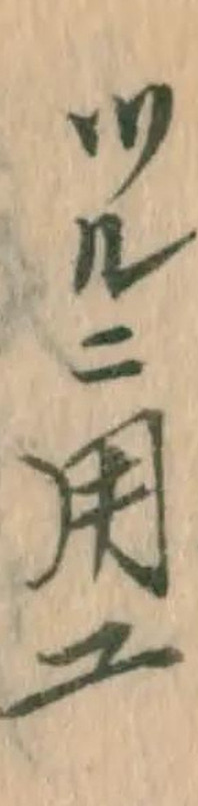ツルニ用ユ
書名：千蟲譜 3巻. [2]
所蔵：国立国会図書館 National Diet Library, JAPAN
